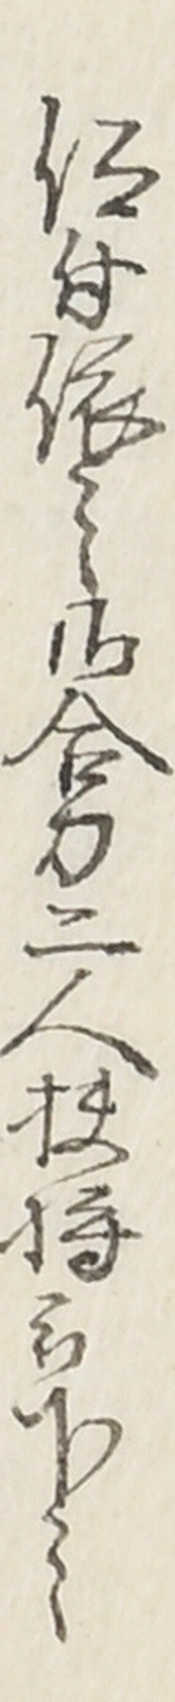番被仰付依之御合力二人扶持被下之
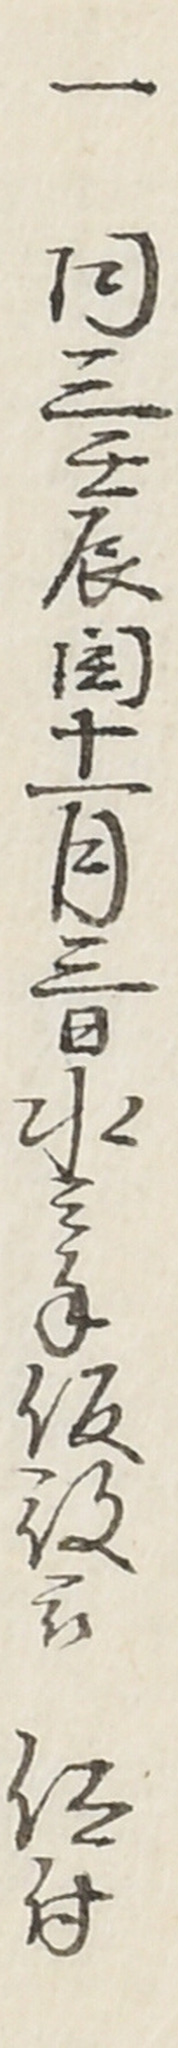一同三壬辰閏十一月三日水之手仮役被仰付
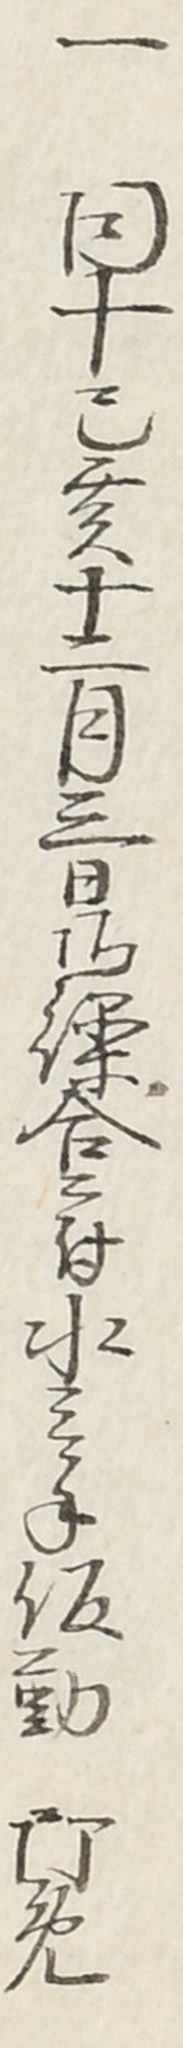一同十己亥十二月三日御繰合ニ付水之手仮勤御免
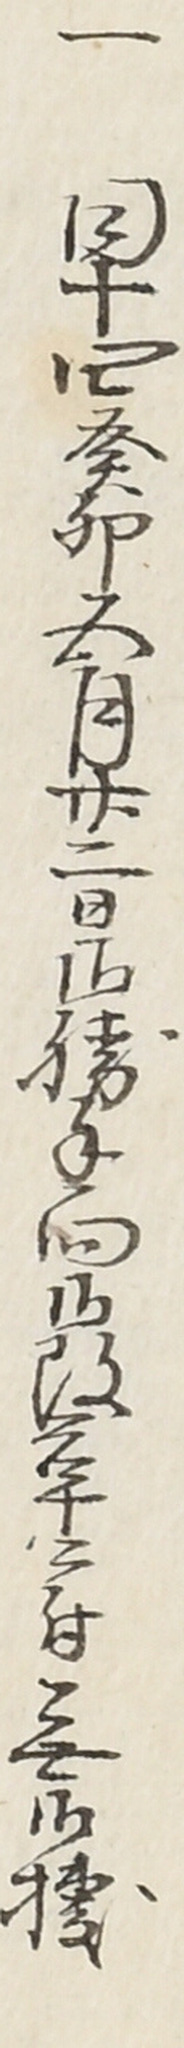一同十四癸卯五月仁廿二日御勝手向御改革ニ付無御拠
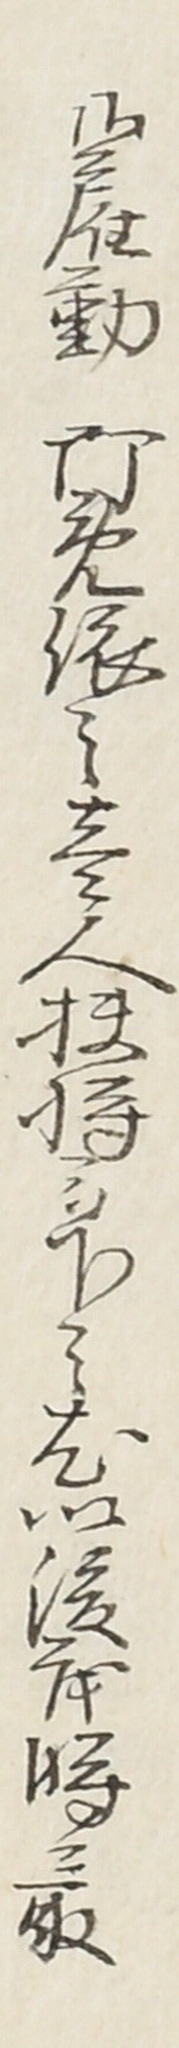御雇勤御免依之壱人扶持被下之尤以後も時ニ取
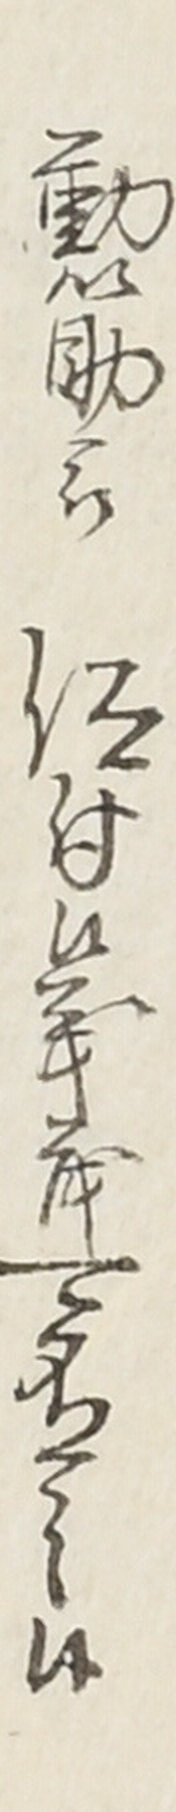勤筋被仰付候義も可有之候
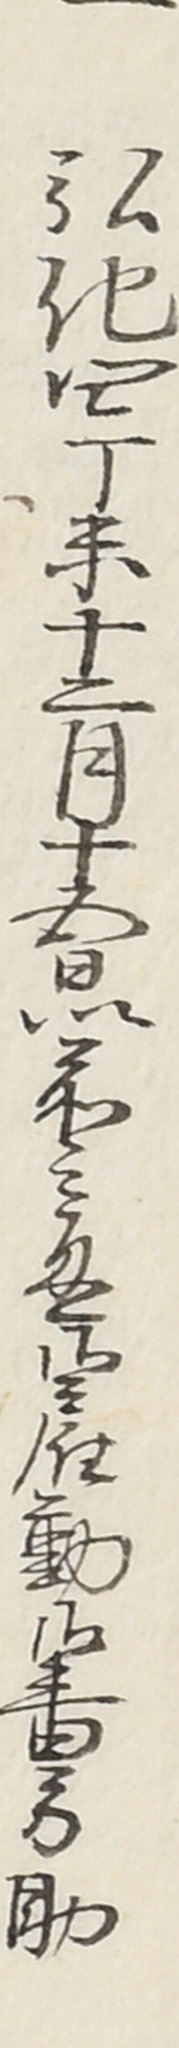一弘化四丁未十二月十五日以前之通御雇勤御番方助
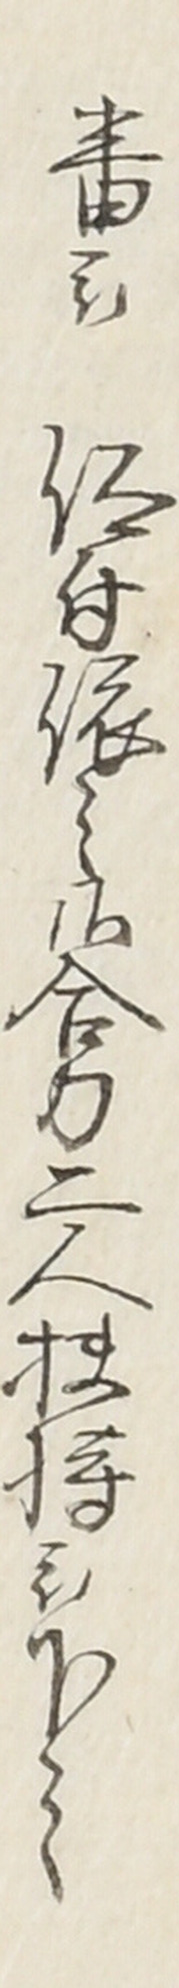番被仰付依之御合力二人扶持被下之
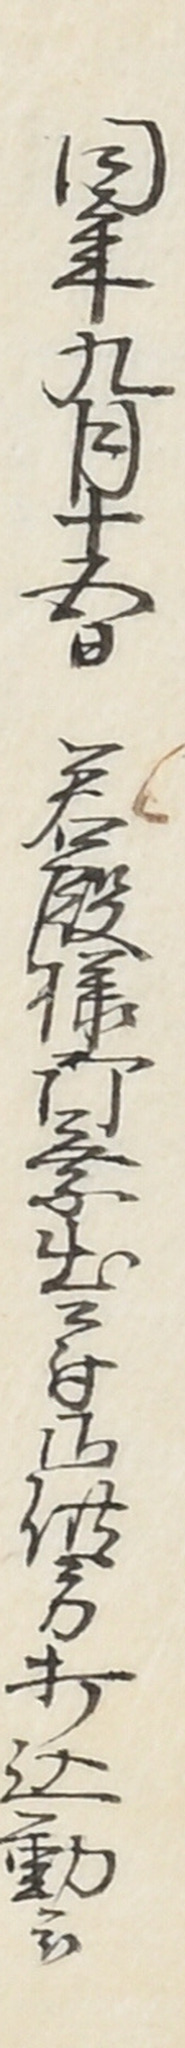一同年九月十五日若殿様御乗出ニ付御供方打込勤被
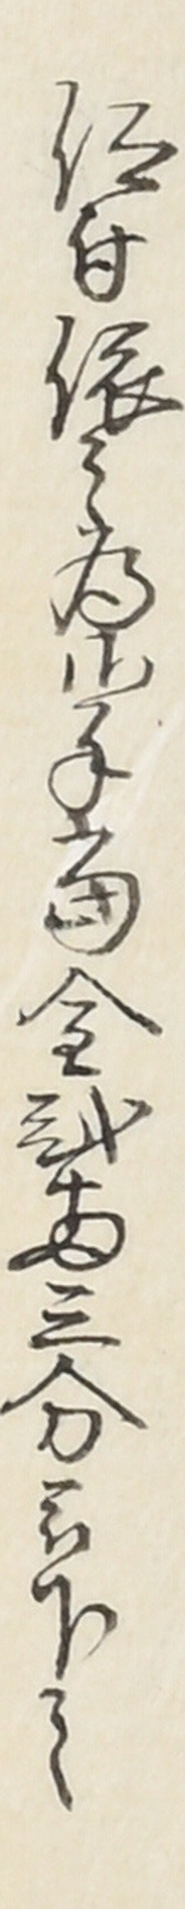仰付依之為御手当金弐両三分被下之

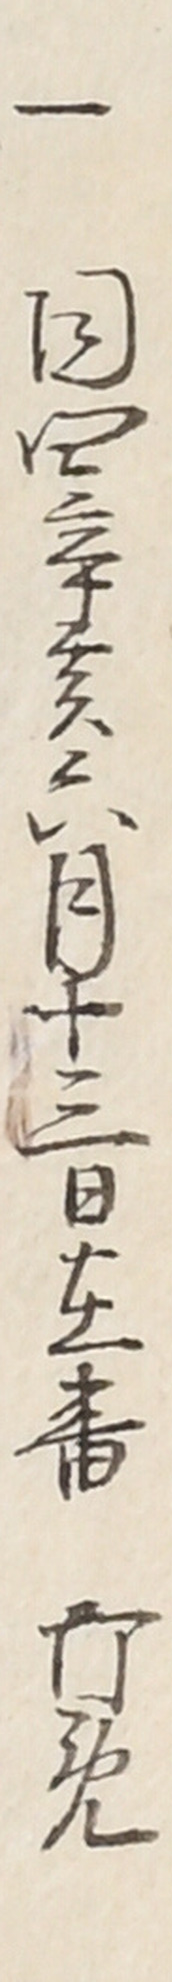一同四辛亥六月十三日在番御免
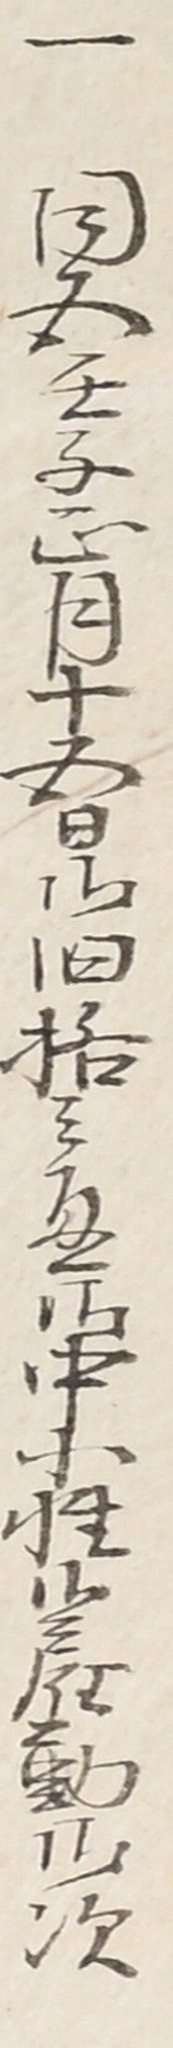一同五壬子正月十五日御旧格之通中小性御雇勤御次
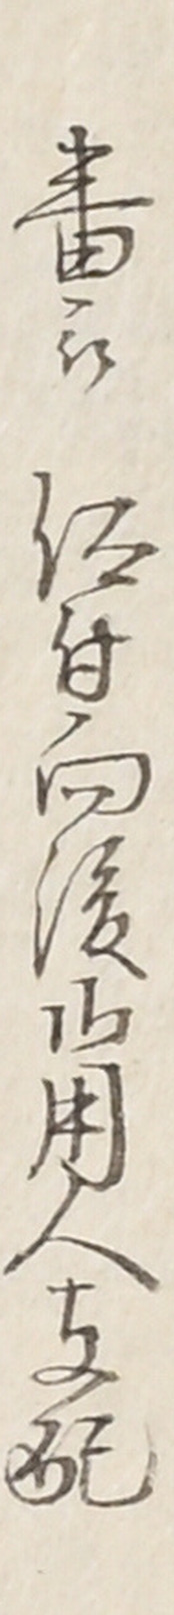番被仰付向後御用人支配
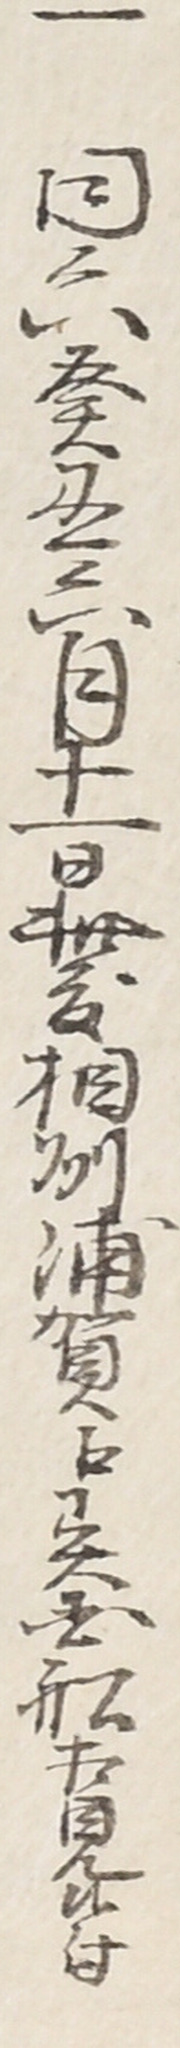一同六癸丑六月十一日此度相州浦賀江異国船相見候付
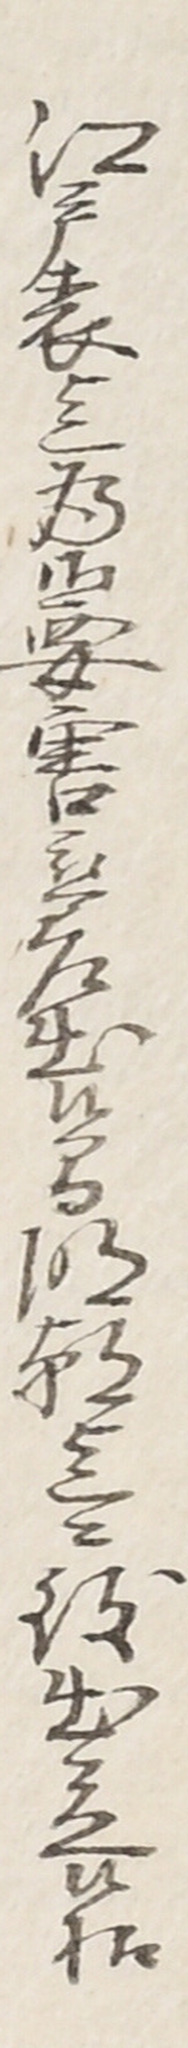江戸表迄為御要害被差出候間明朝迄ニ致出立候様
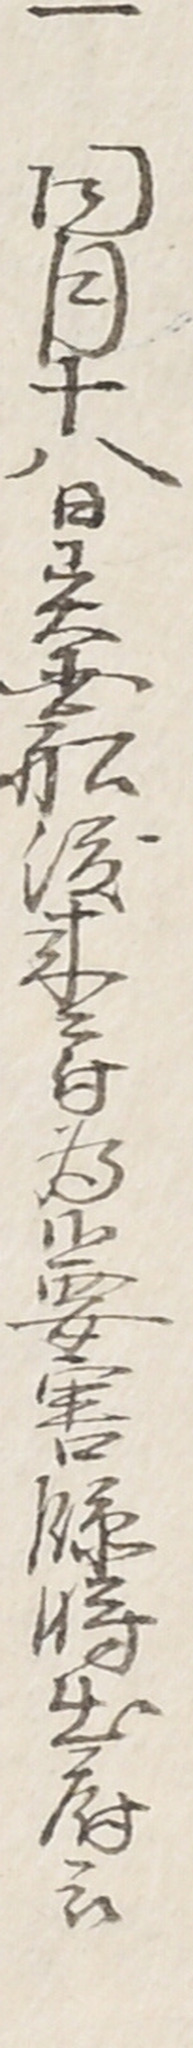一同月十八日異国船渡来ニ付為御要害臨時出府被
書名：給人諸士勤仕録（七）
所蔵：伊那市立高遠町図書館・合同会社AMANE
